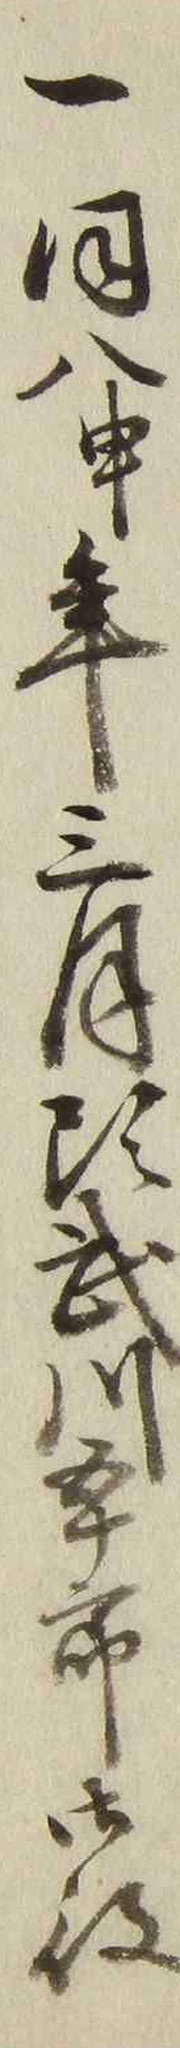一同八申年三月頭武川五十郎御役

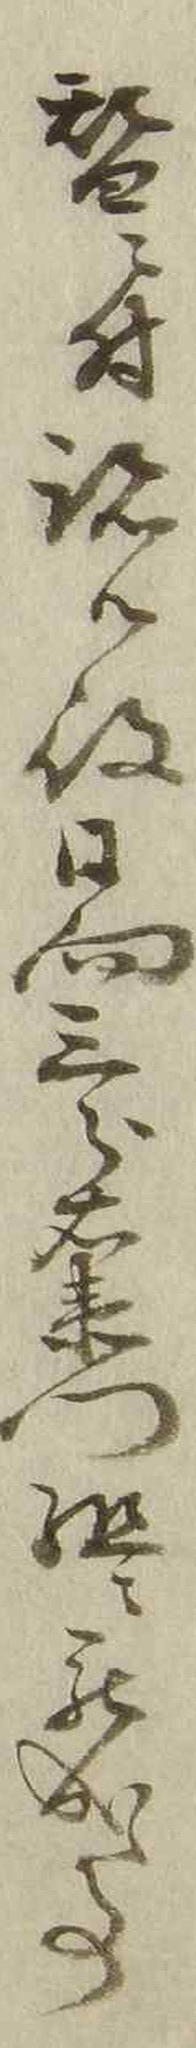替ニ付跡御役日向三郎右衛門組ニ罷成候事
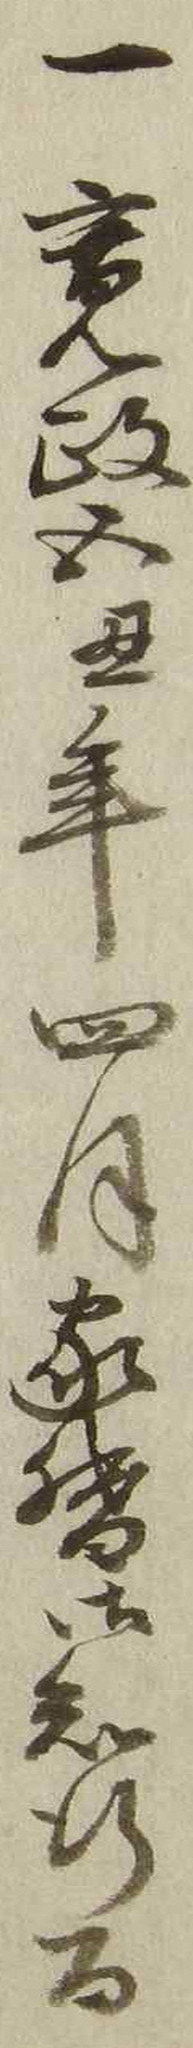一寛政五丑年四月家督御知行百
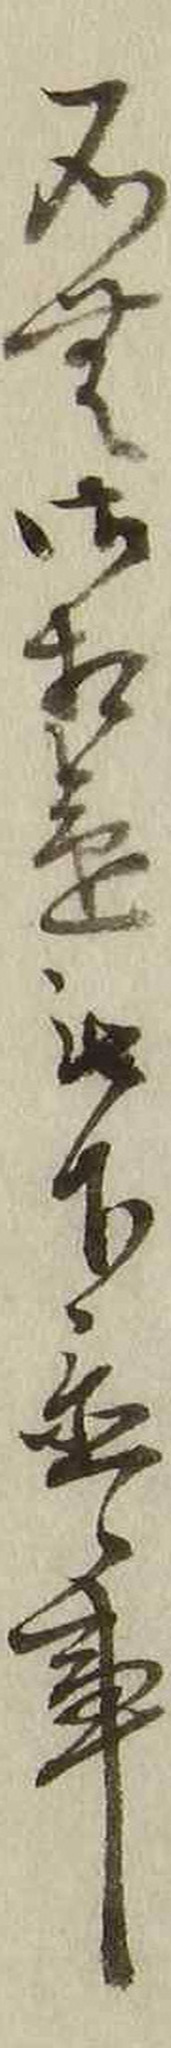石無御相違被下置候事
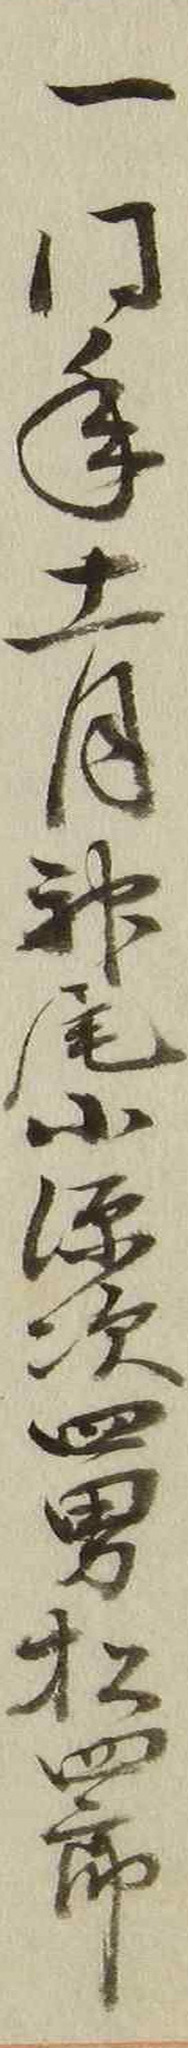一同年十一月神尾小源次四男松四郎
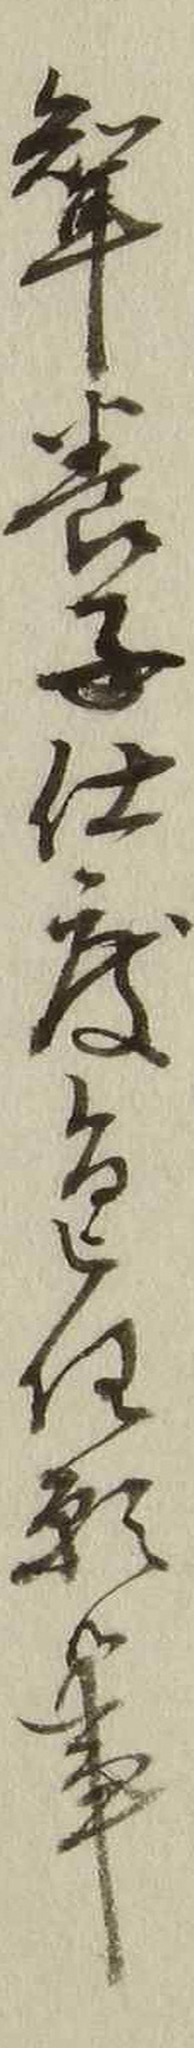聟養子仕度旨被任願候事
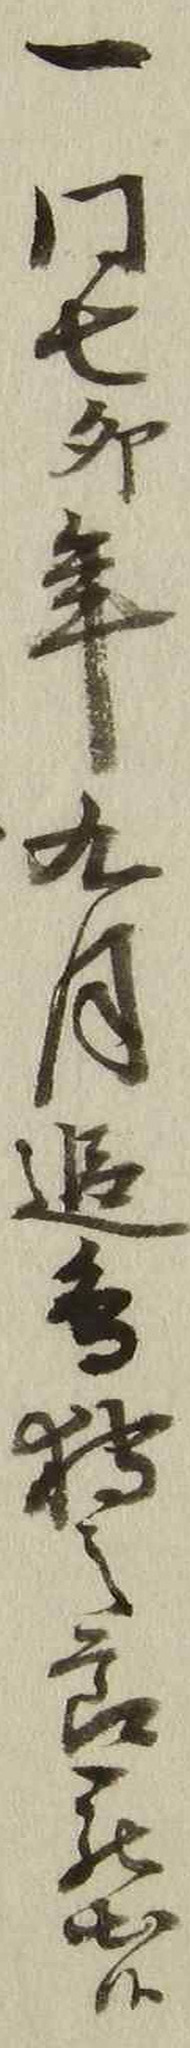一同七卯年九月追鳥狩之節罷出候
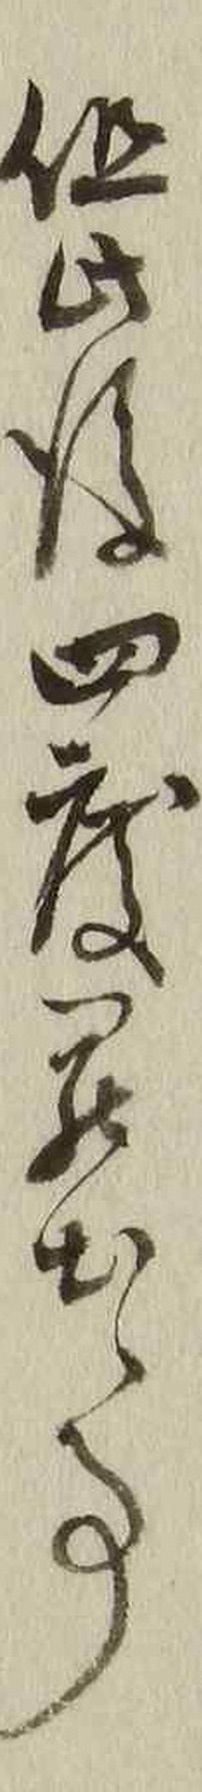但此後四度罷出候事
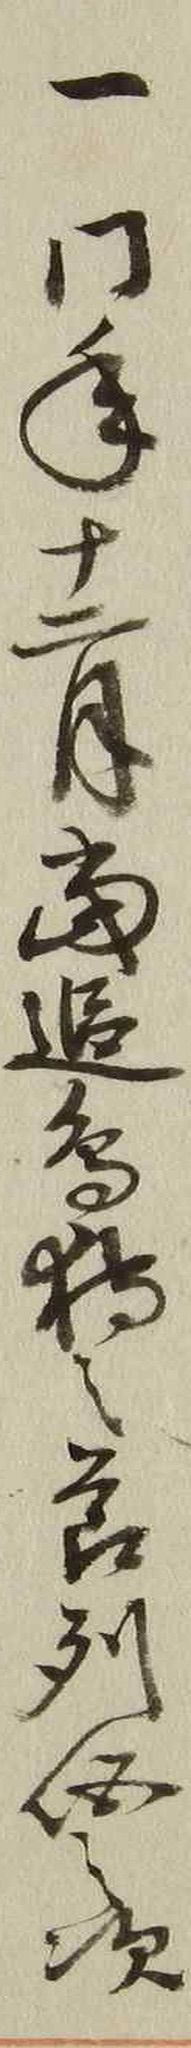一同年十二月当追鳥狩之節列伍之次
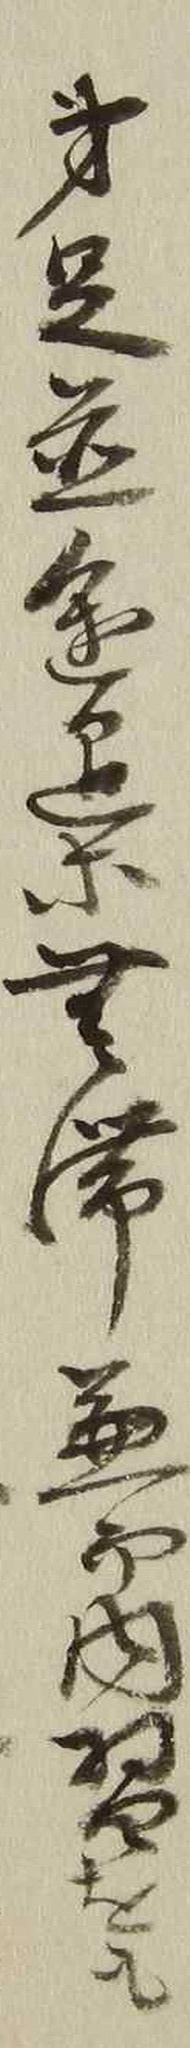第足並進退等無滞兼而内習をも
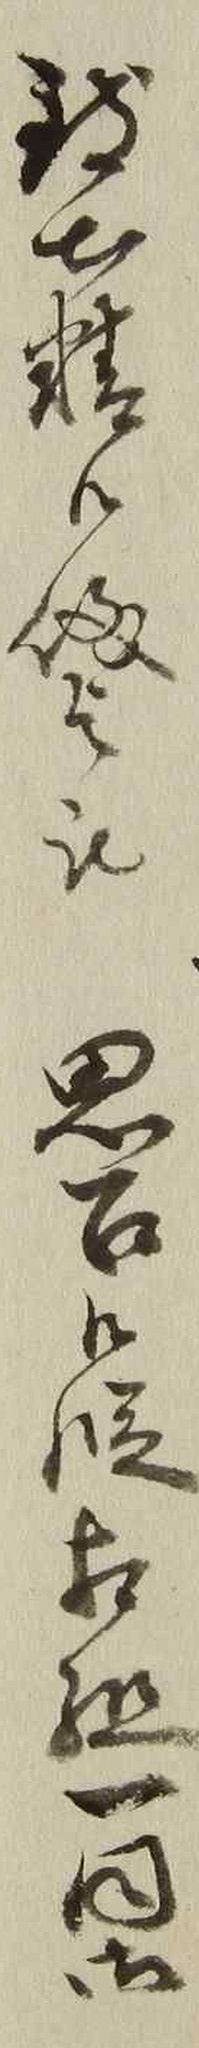致出精候儀与被思召候段相組一同御
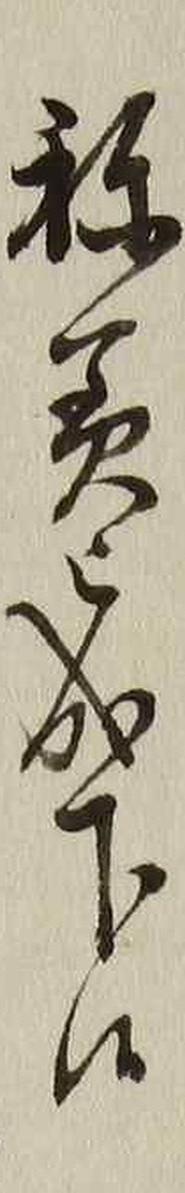称美被成下候
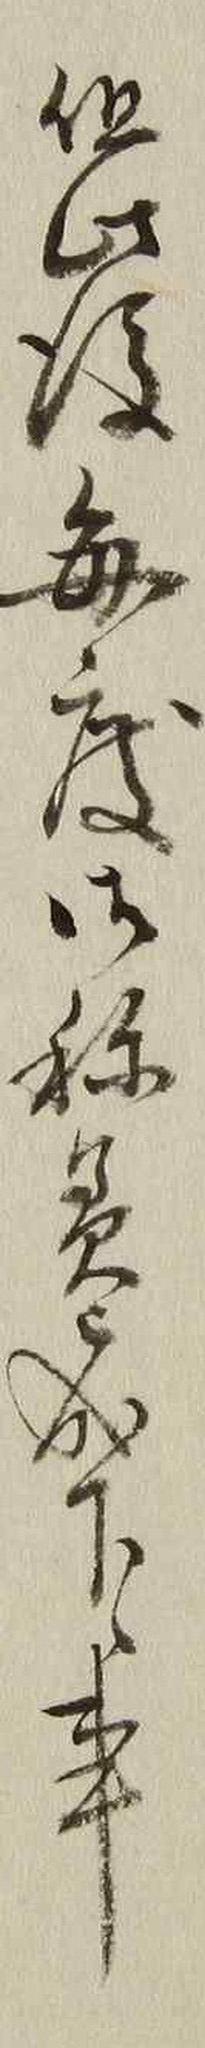但此後毎度御称美被成下候事
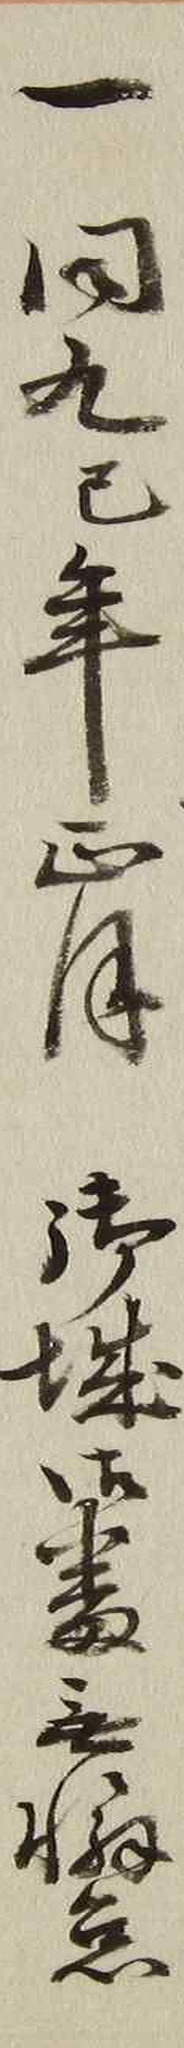一同九巳年正月御城御番無懈怠
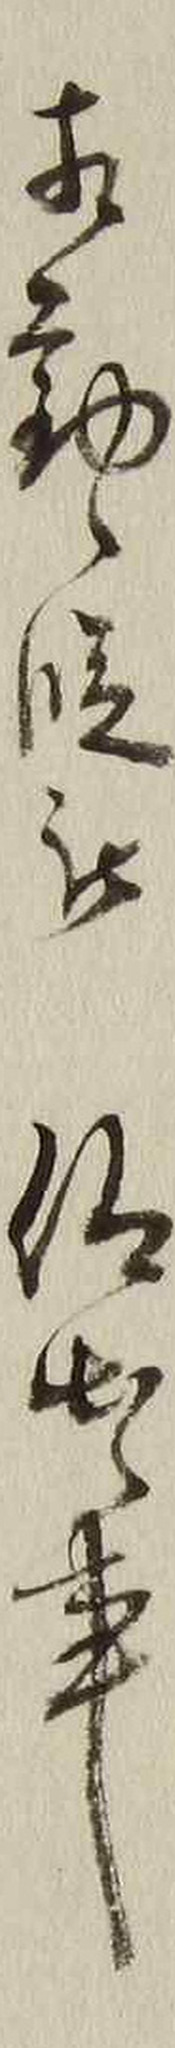相勤候段被仰出候事
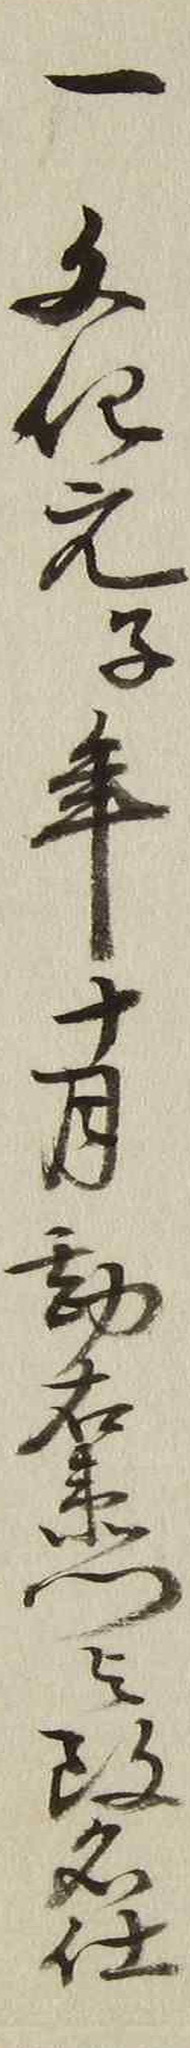一文化元子年十月勘右衛門与改名仕
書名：諸士系譜　巻之27　い之部27
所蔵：会津若松市立会津図書館
